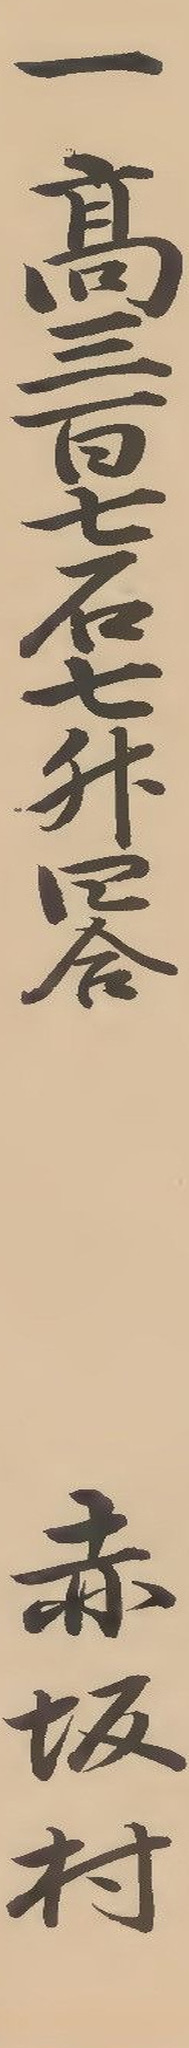一高三百七石七升四合赤坂村
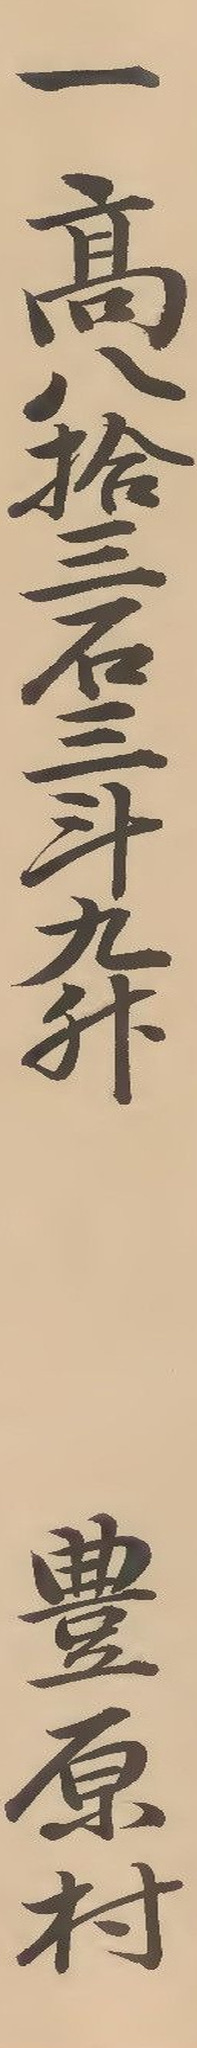一高八拾三石三斗九升豊原村
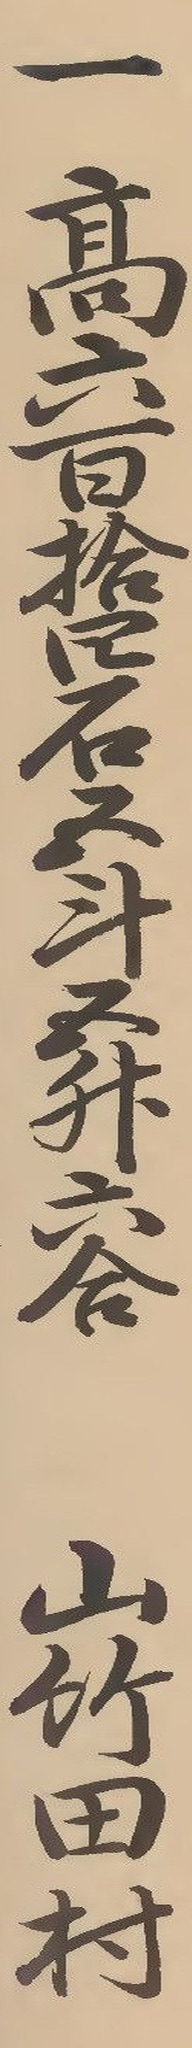一高六百拾四石五斗五升六合山竹田村
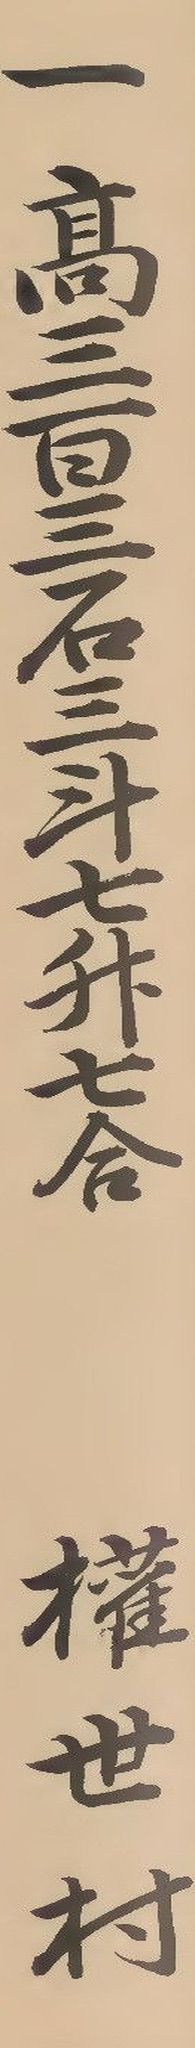一高三百三石三斗七升七合権世村
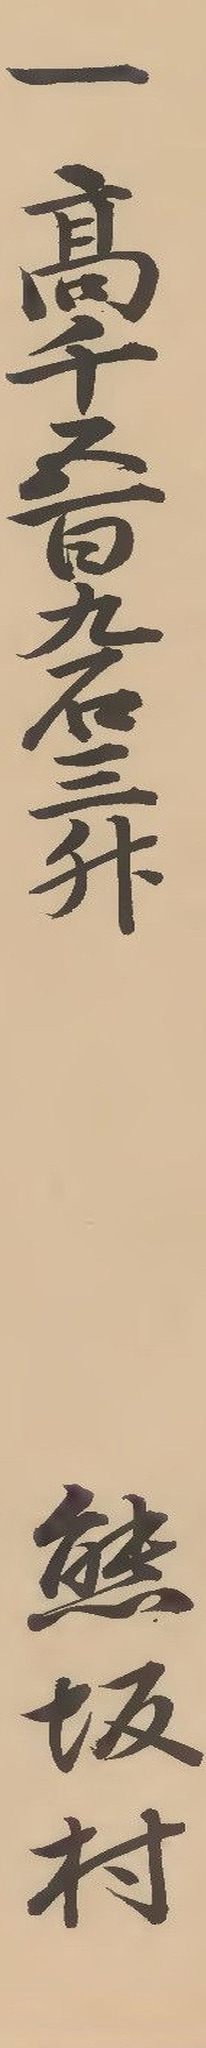一高千五百九石三升熊坂村
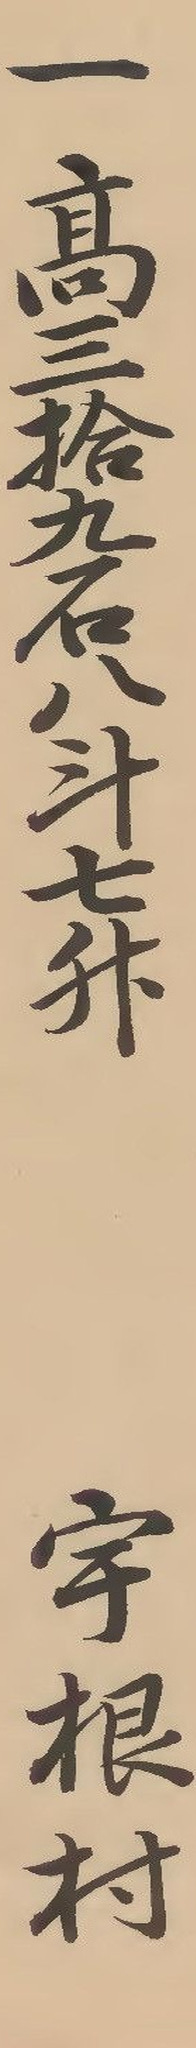一高三拾九石八斗七升宇根村

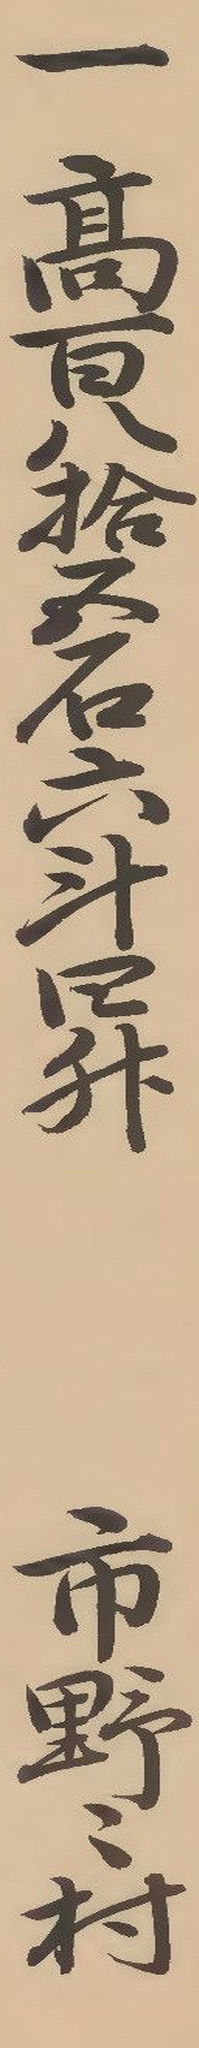一高百八拾五石六斗四升市野々村
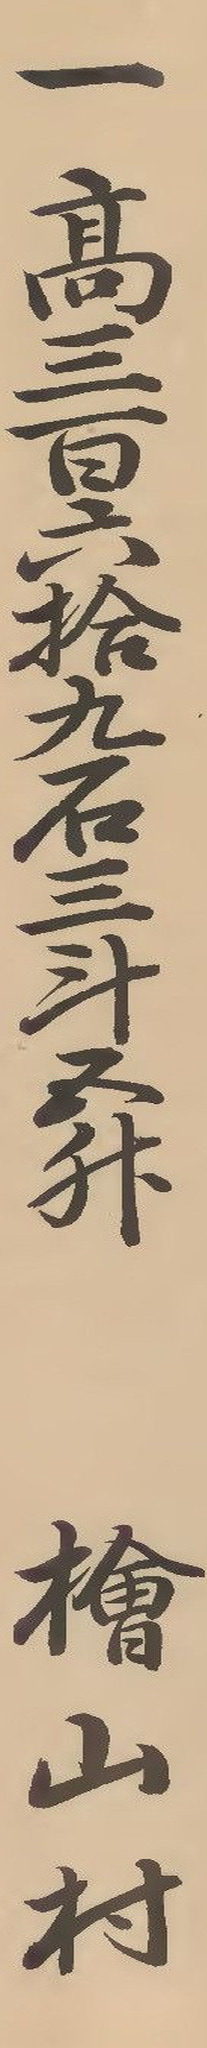一高三百六拾九石三斗五升桧山村
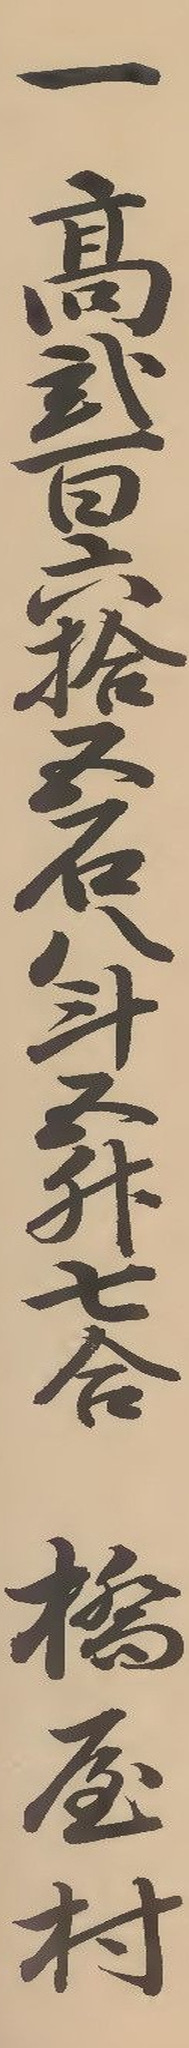一高弐百六拾五石八斗五升七合橋屋村
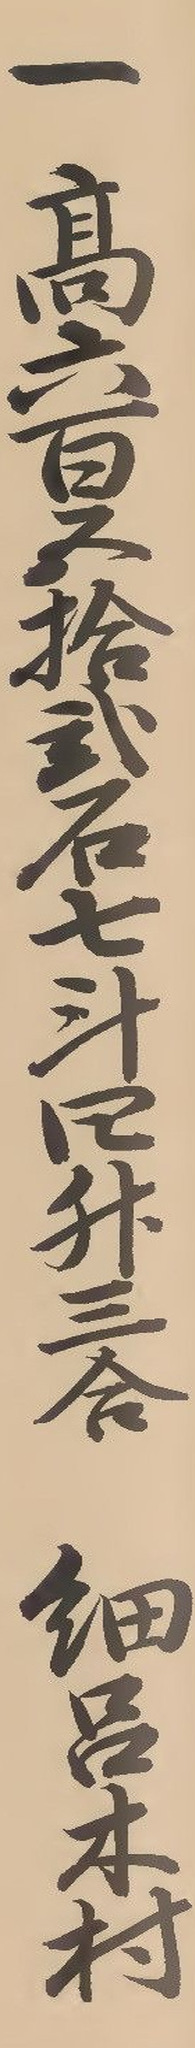一高六百五拾弐石七斗四升三合細呂木村
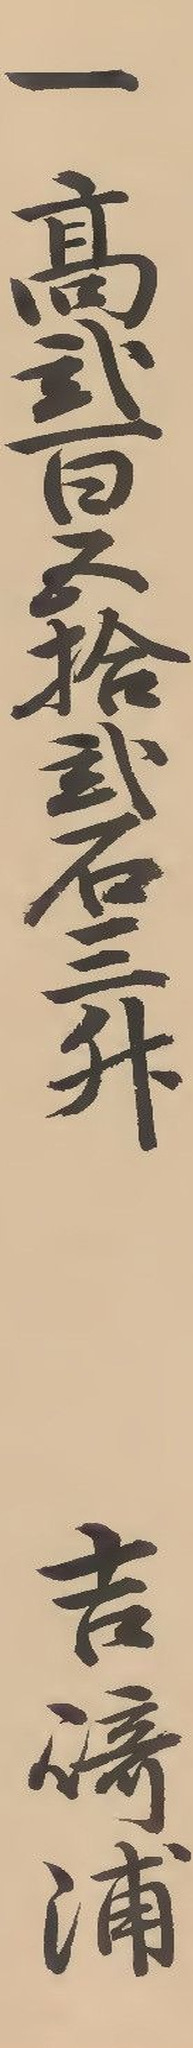一高弐百五拾弐石三升吉崎浦
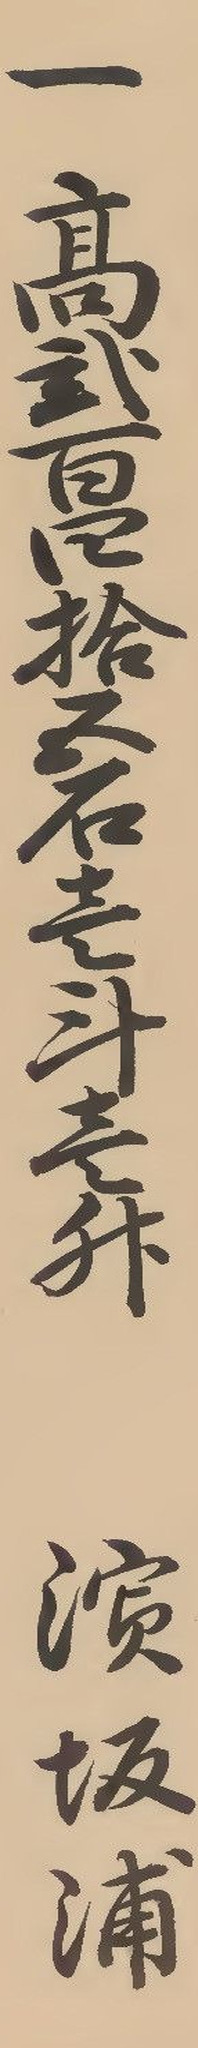一高弐百四拾五石壱斗壱升浜坂浦
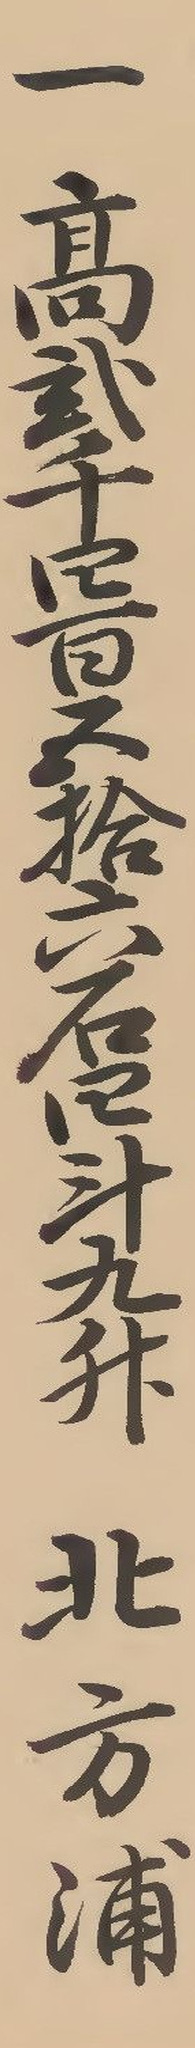一高弐千四百五拾六石四斗九升北方浦

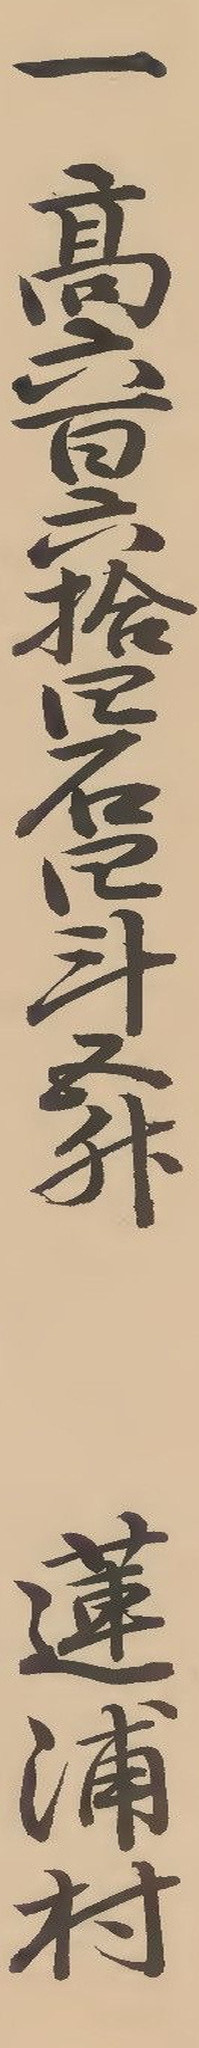一高六百六拾四石四斗五升蓮浦村
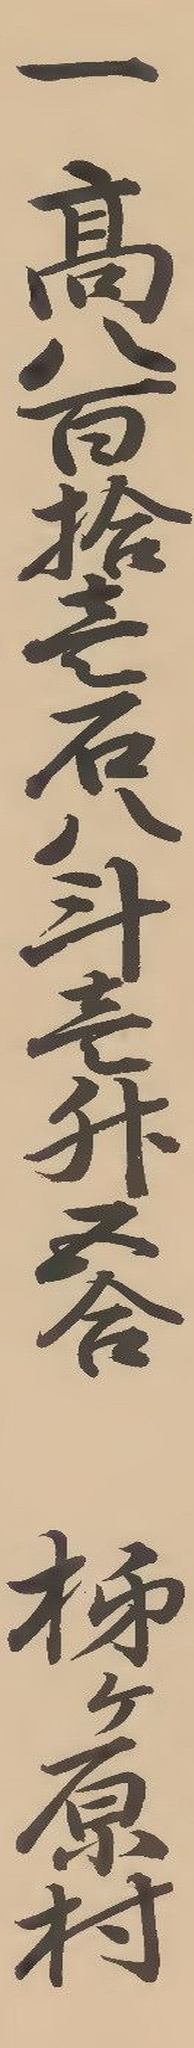一高八百拾壱石八斗壱升五合柿ヶ原村
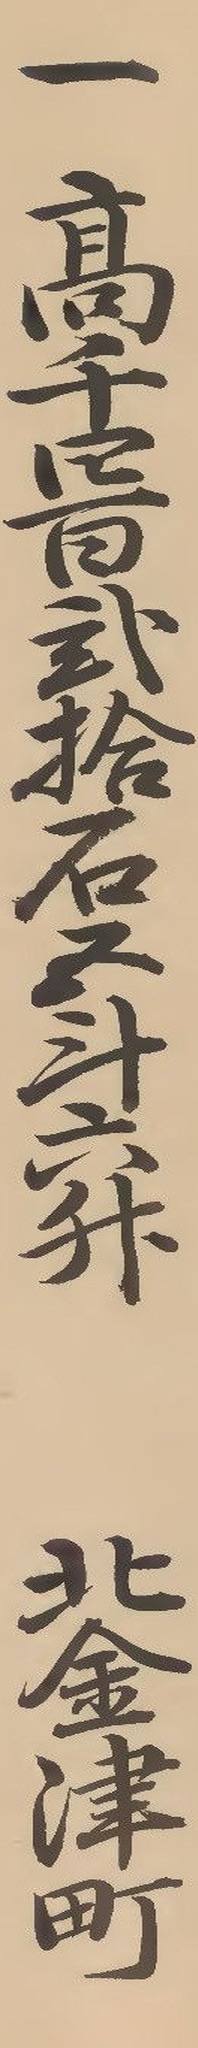一高千四百弐拾石五斗六升北金津町
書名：越前国郷帳
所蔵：国立公文書館 National Archives of Japan
